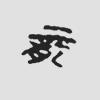龍
